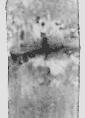七
